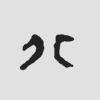北
